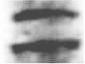二
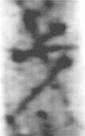戈
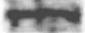一
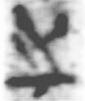之
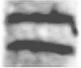二
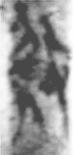○（紛）
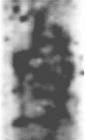○（纁）
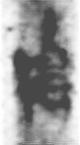○（組）
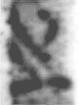之
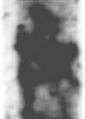綏
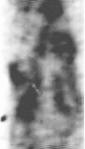顯（韅）
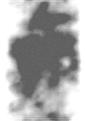鞅
